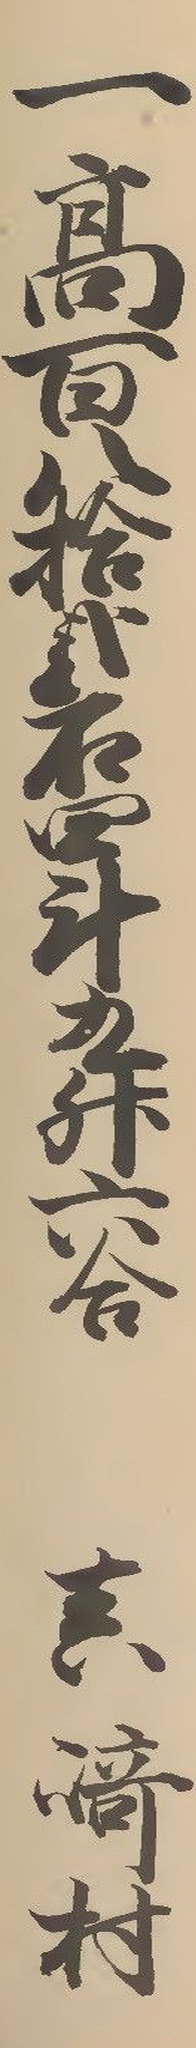一髙百八拾弐石四斗九升六合真崎村
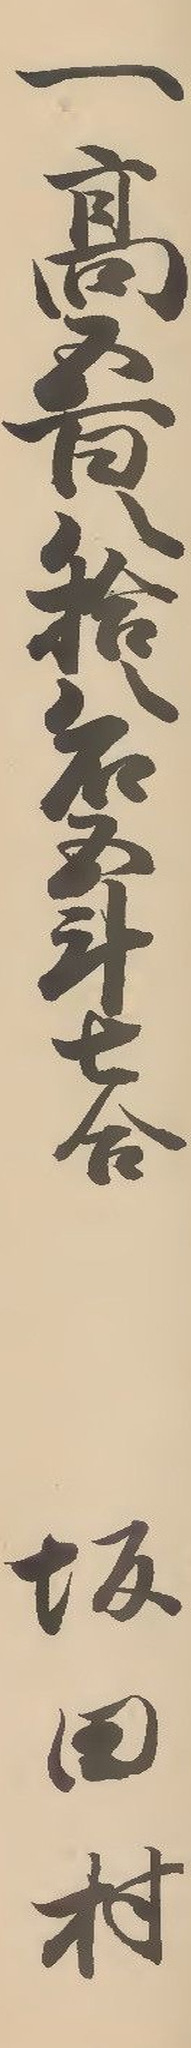一髙五百八拾八石五斗七合坂田村
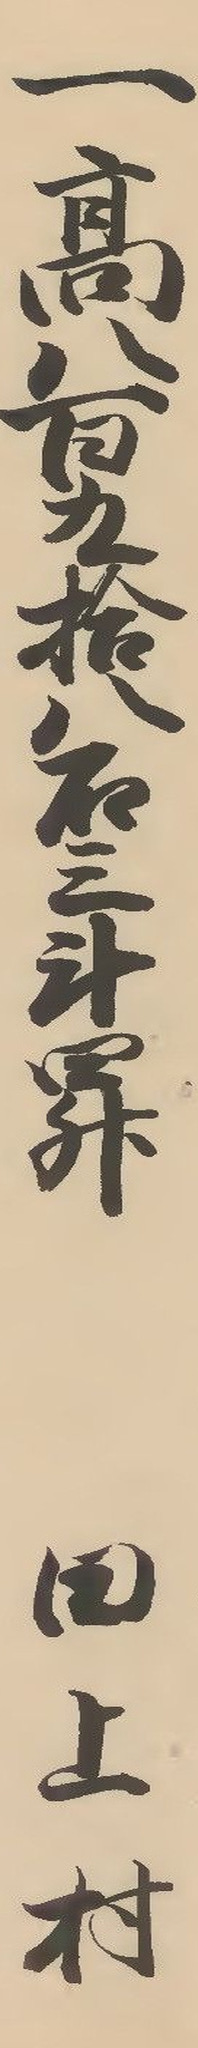一髙八百九拾八石三斗四升田上村
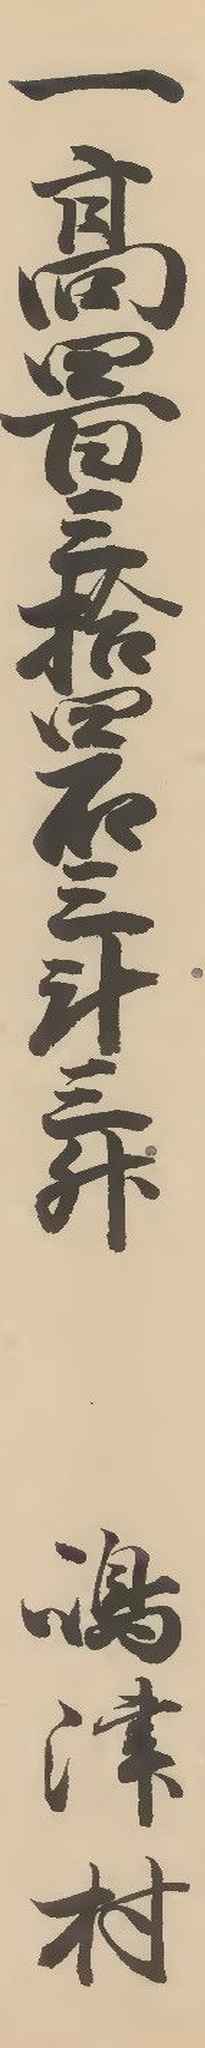一髙四百三拾四石三斗三升嶋津村
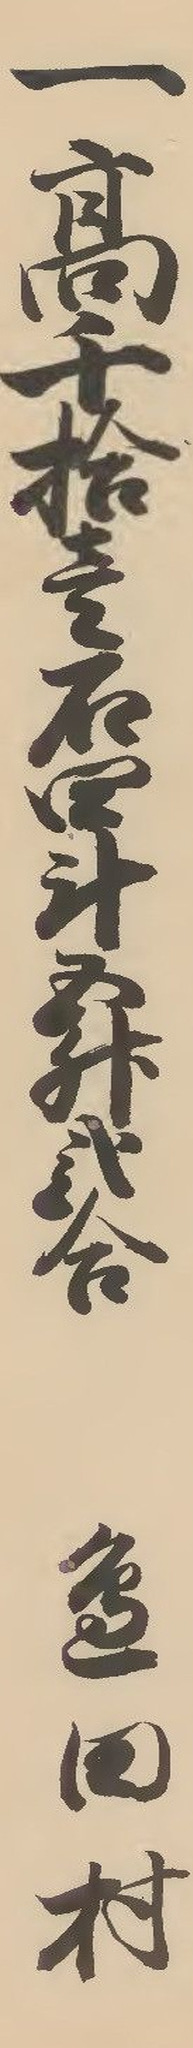一髙千拾壱石四斗五升弐合邊田村

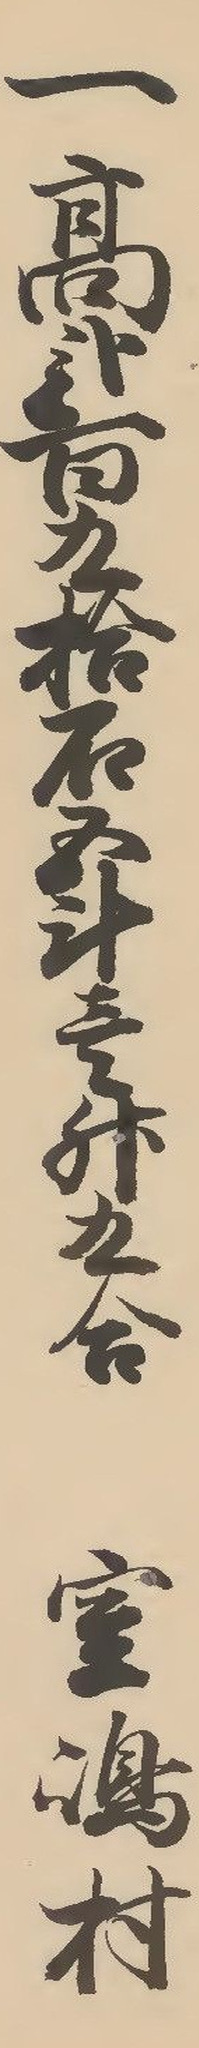一髙弐百九拾石五斗壱升九合室嶋村
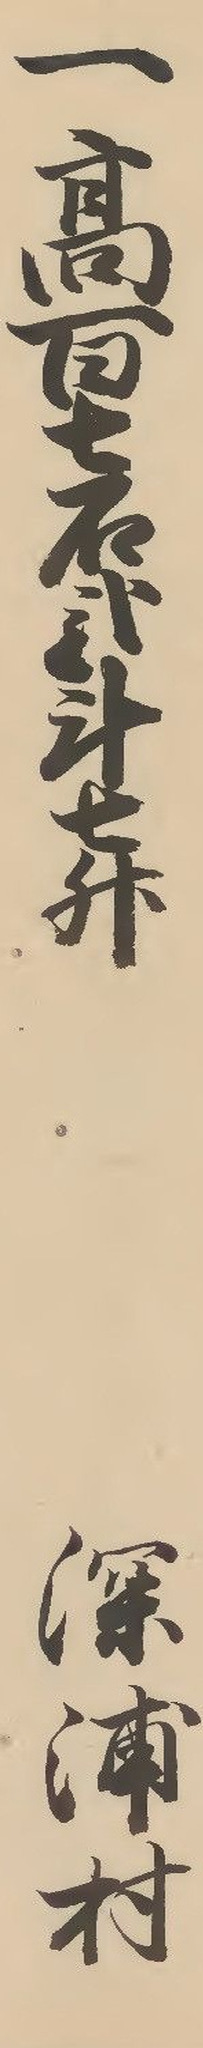一髙百七石弐斗七升深浦村
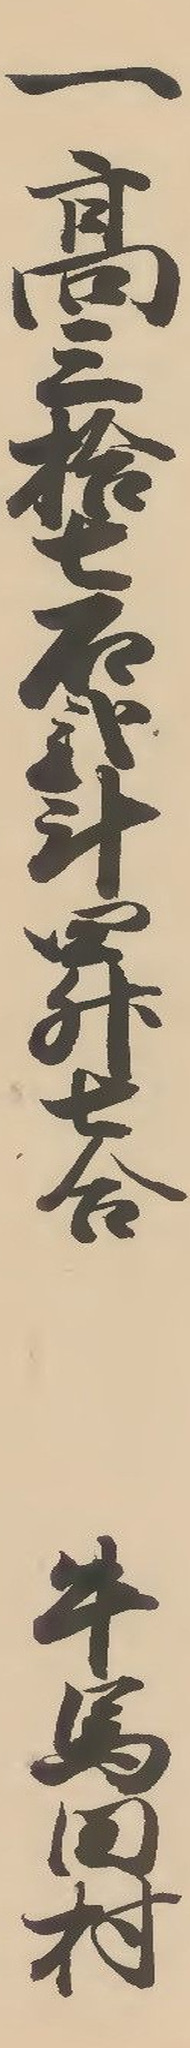一髙三拾七石二斗四升七合牛馬田村
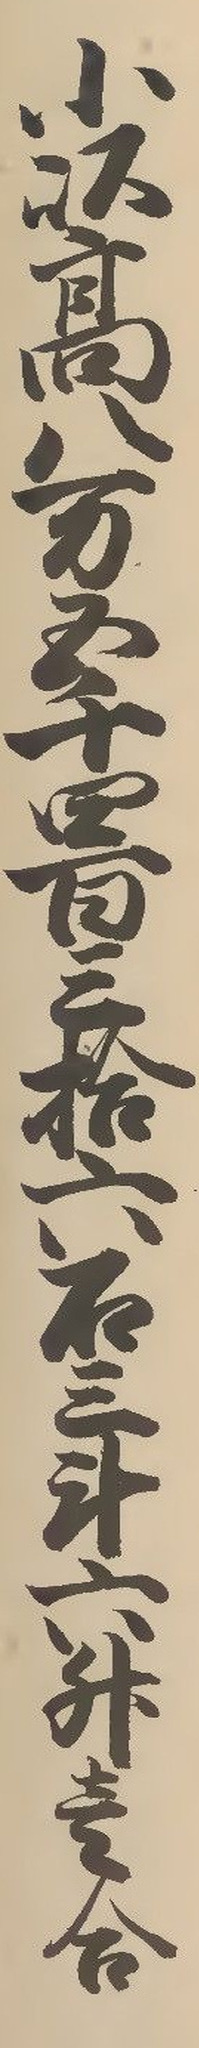小以髙八万五千四百三拾六石三斗六升壱合

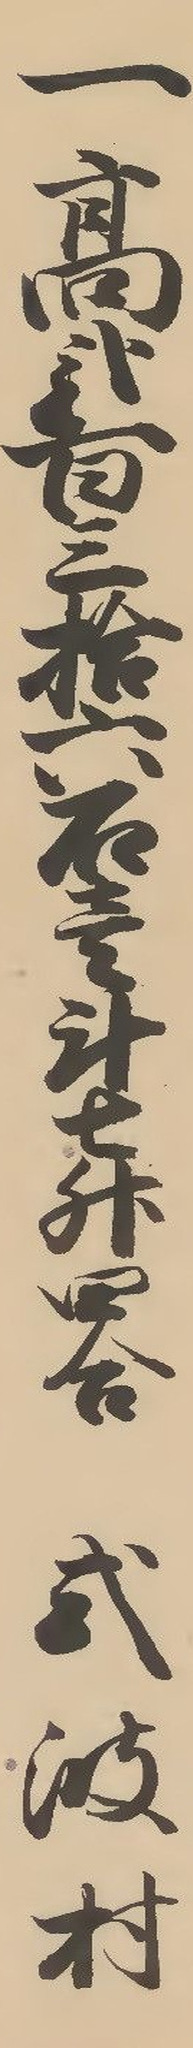一髙弐百三拾六石壱斗七升四合式波村
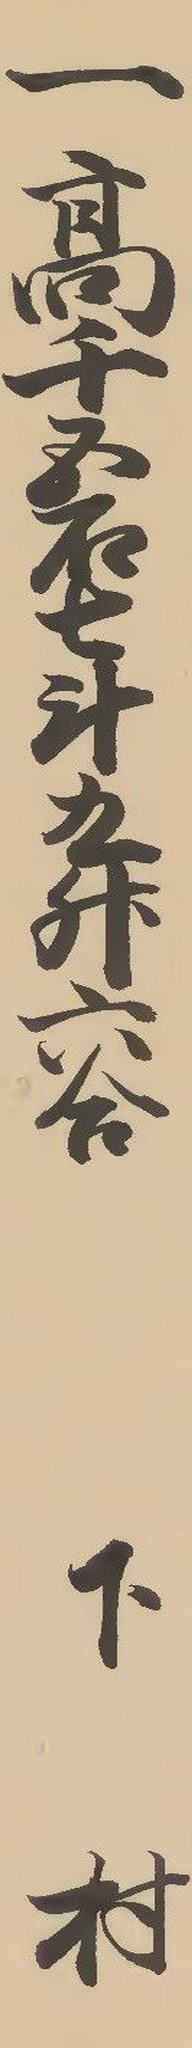一髙千五石七斗九升六合下村
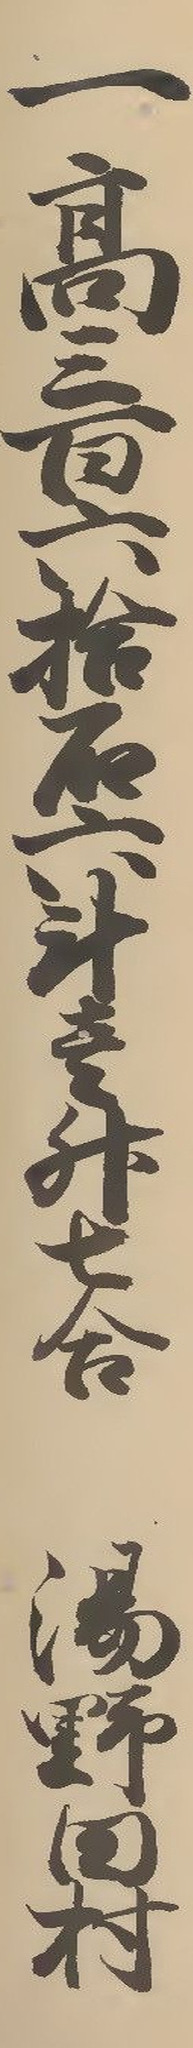一髙三百六拾石六斗壱升七合湯野田村
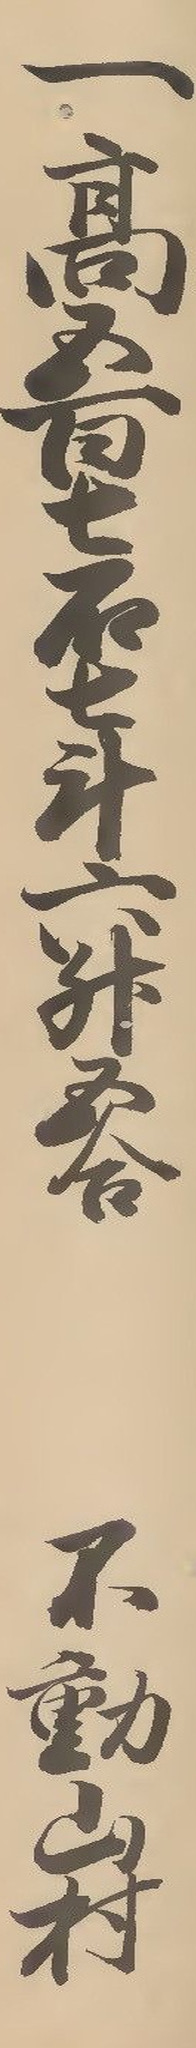一髙五百七石七斗六升五合不動山村
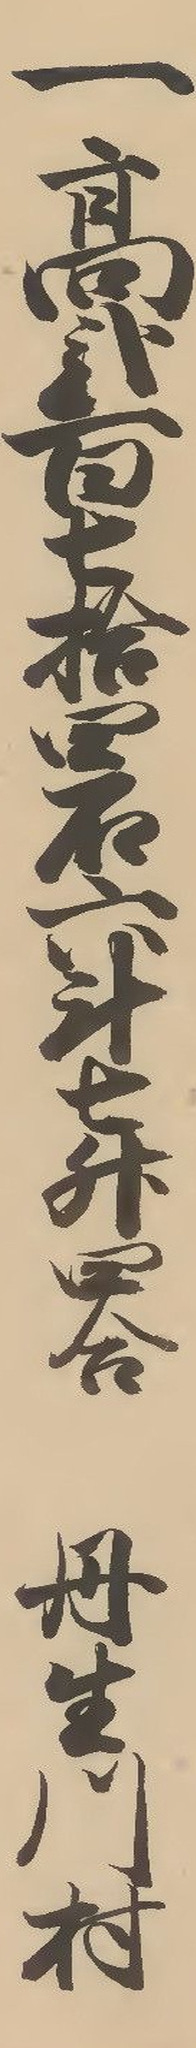一髙弐百七拾四石六斗七升四合丹生川村
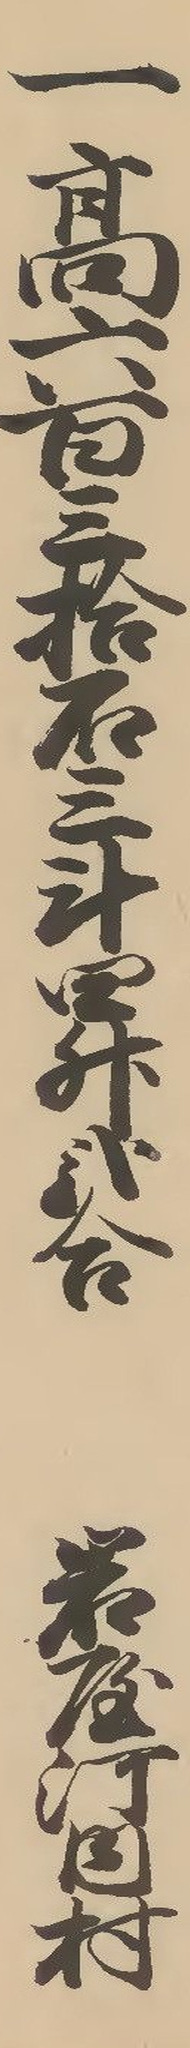一髙六百三拾石三斗四升弐合若屋河内村
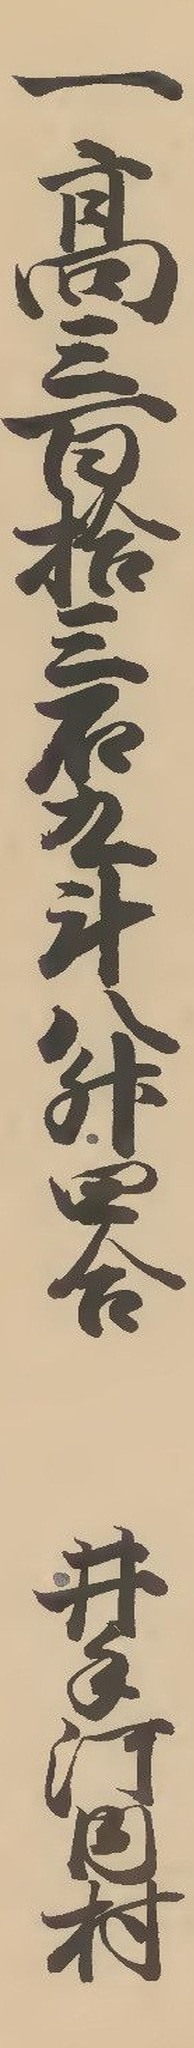一髙三百拾三石九斗八升四合井手河内村
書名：肥前国郷帳
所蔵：国立公文書館 National Archives of Japan
